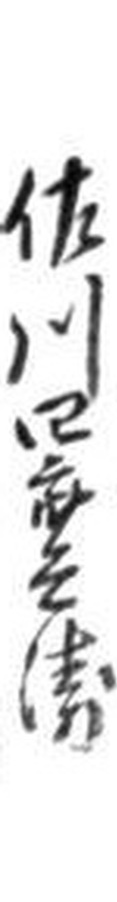佐川四郎兵衛
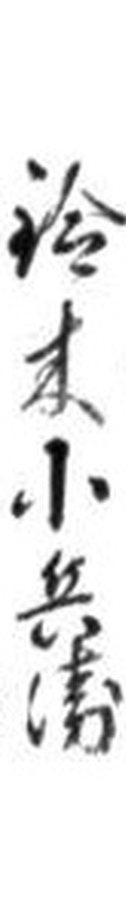鈴木小兵衛
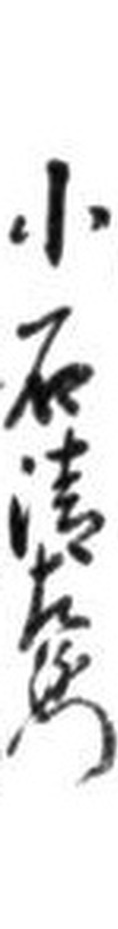小石清左衛門
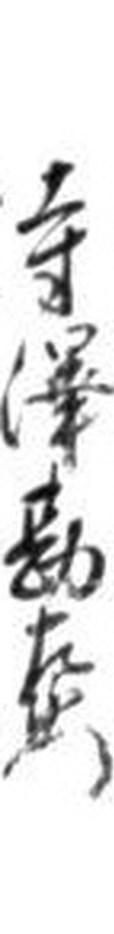寺沢勘左衛門
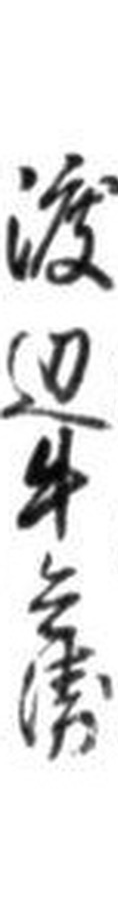渡辺牛兵衛
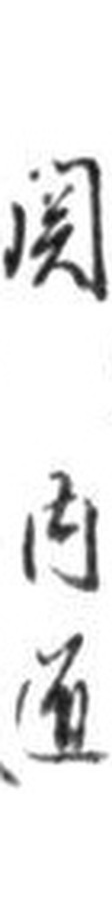関内匠
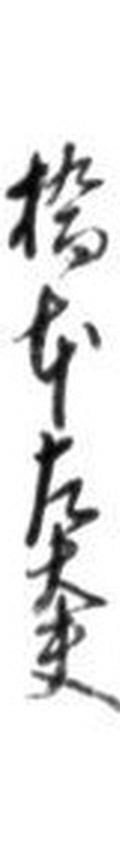橋本左大夫
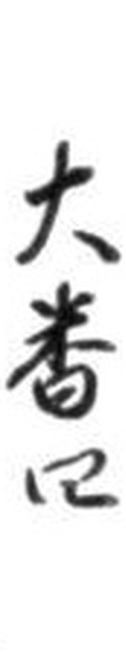大番四
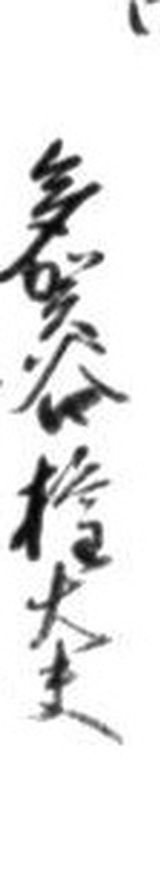多賀谷権大夫
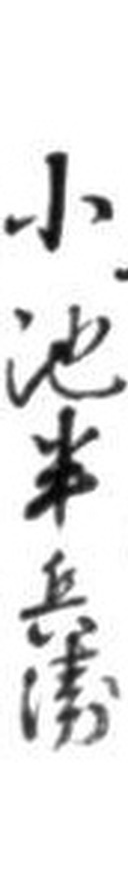小池半兵衛
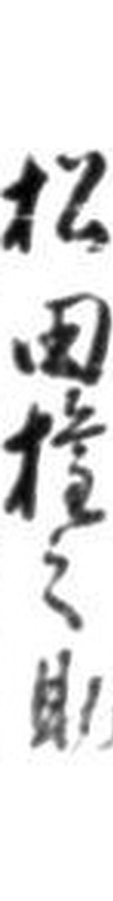松田権之助
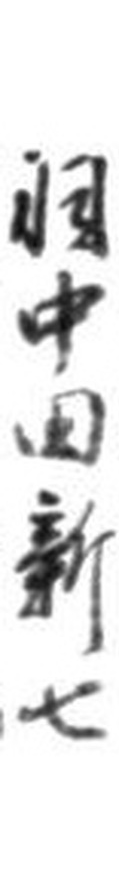羽中田新七
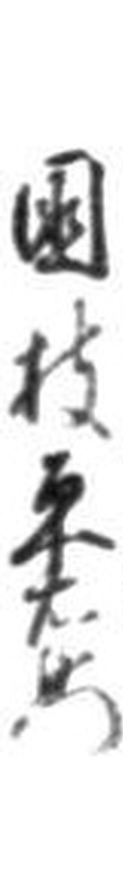国枝平右衛門
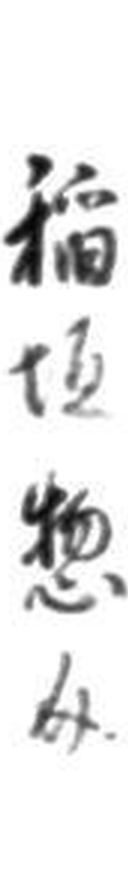稲垣惣介
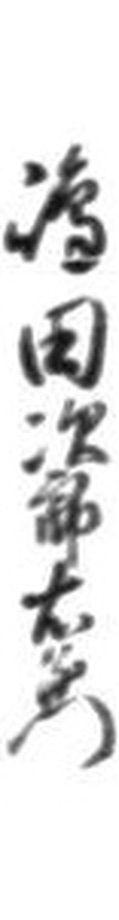嶋田次郎右衛門
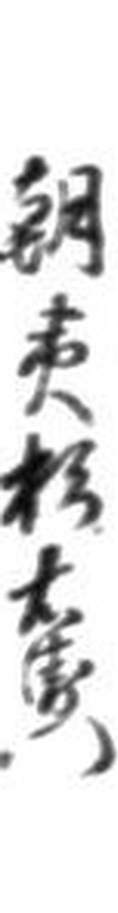朝夷松右衛門
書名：家譜 二 忠直公 従文禄四年到慶安四年
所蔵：福井県文書館 Fukui Prefectural Archives
